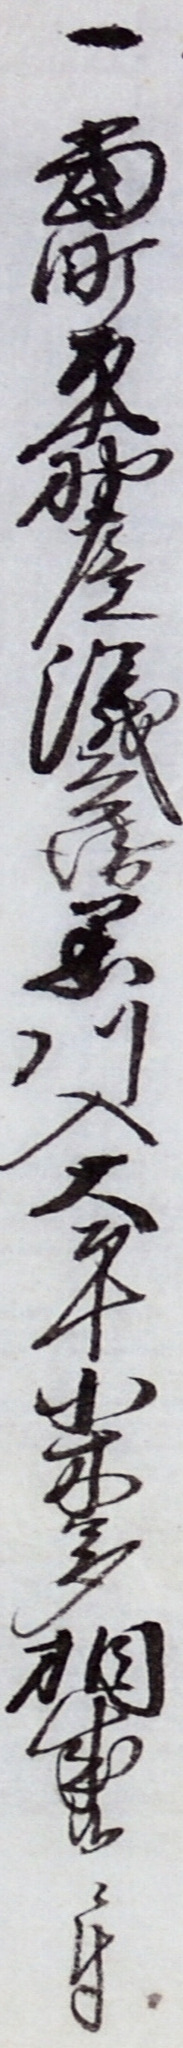一当町平野屋儀兵衛黒川入大平小木多相成候ニ付
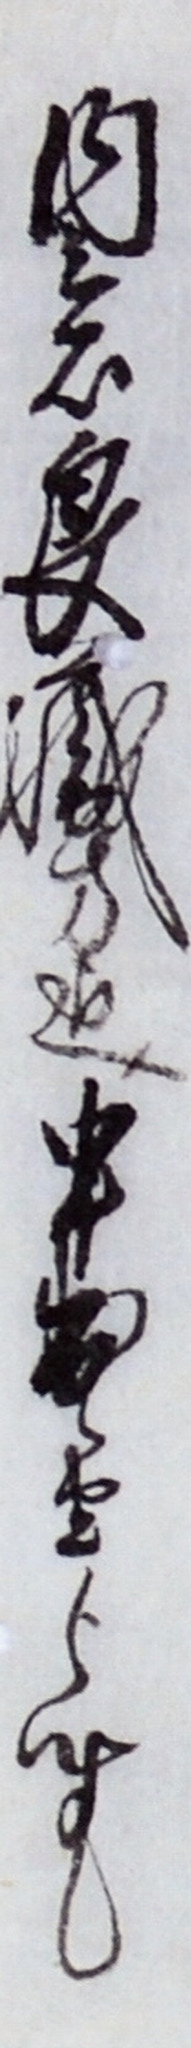内は良蔵方迄申出候置被聞候
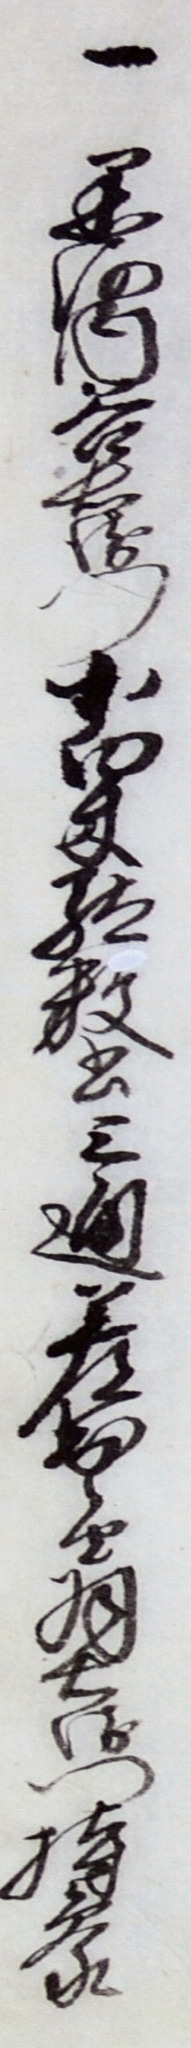一黒河内善右衛門小白木駄数書三通差出之由羽右御門持参

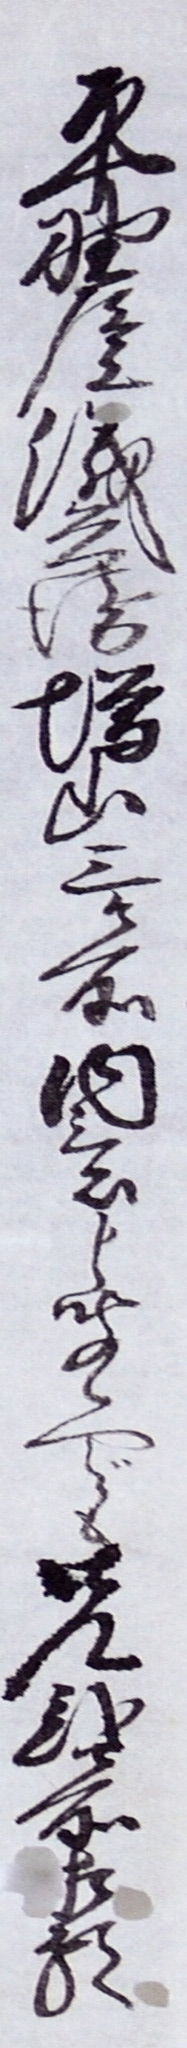一平野屋儀兵衛増山三ヶ所内意申聞候へども先弐ヶ所相願
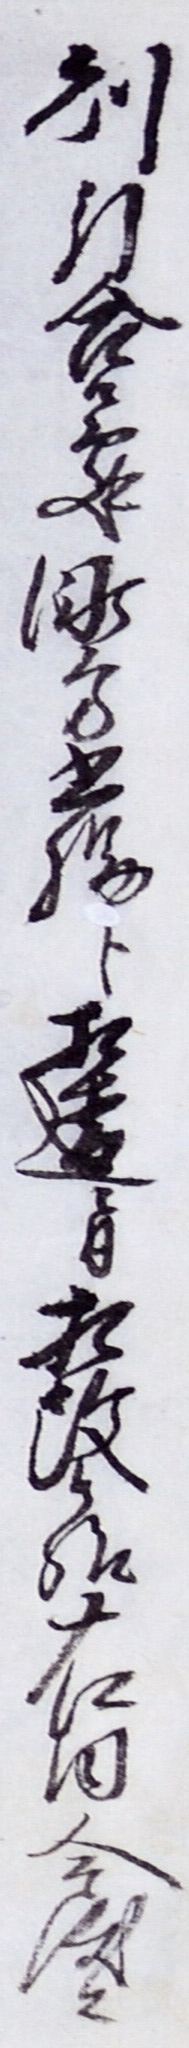別引合候処町方書揚と相違ニ付相改候様右同人戻候
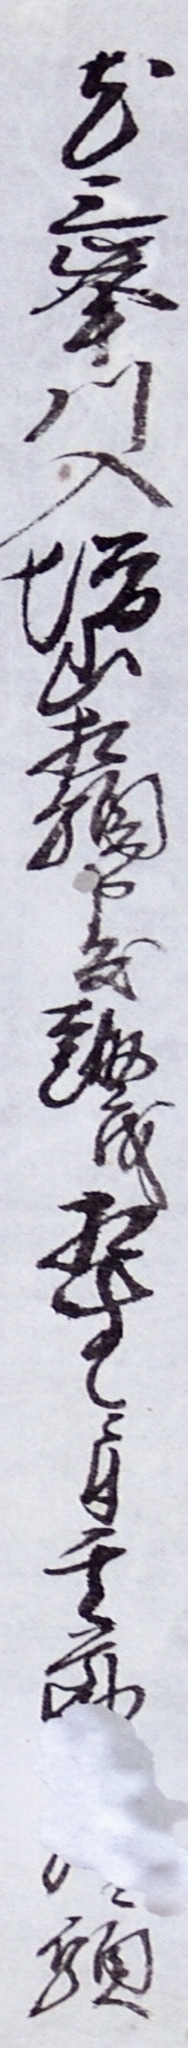尤三峯川入増山相願申度趣も相聞候ニ付其筋願
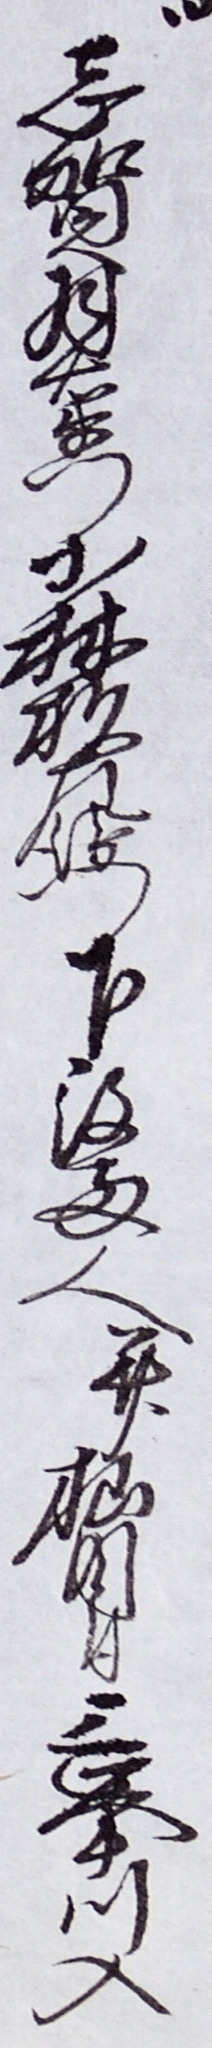一志賀羽右衛門小林杉左衛門下役両人并杣目付三峯川入
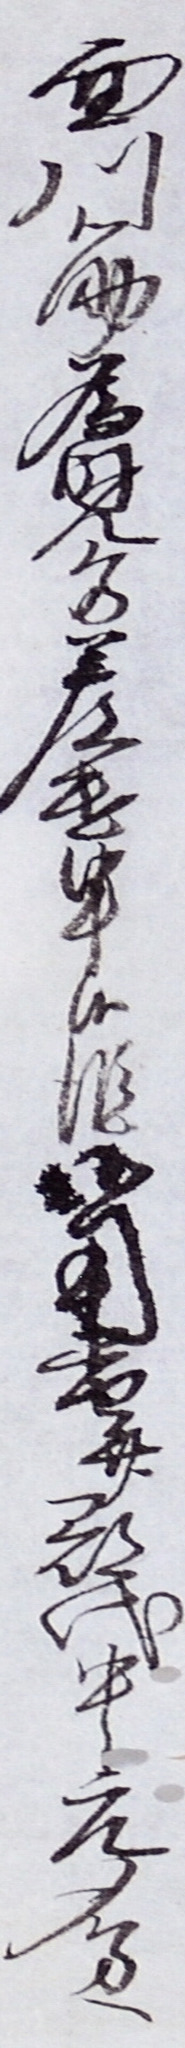面川筋為見分差遣申候段御用番并郡代中元〆方へ
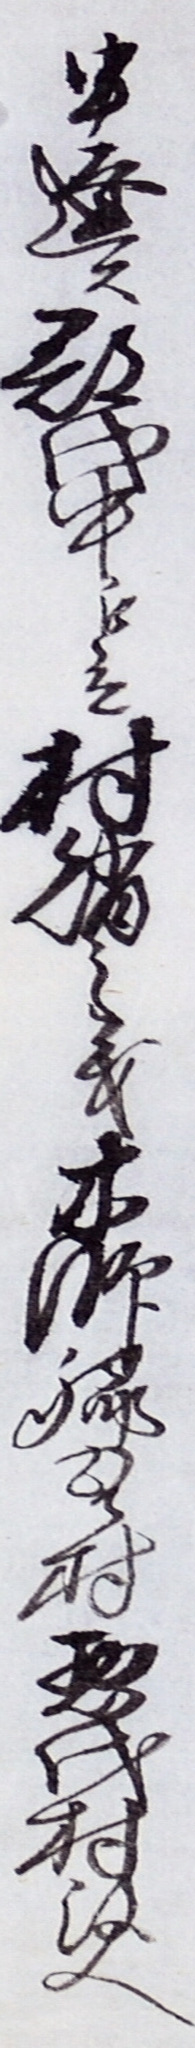申遣ス郡代中江は村賄之義木師郷九ヶ村惣代村役人
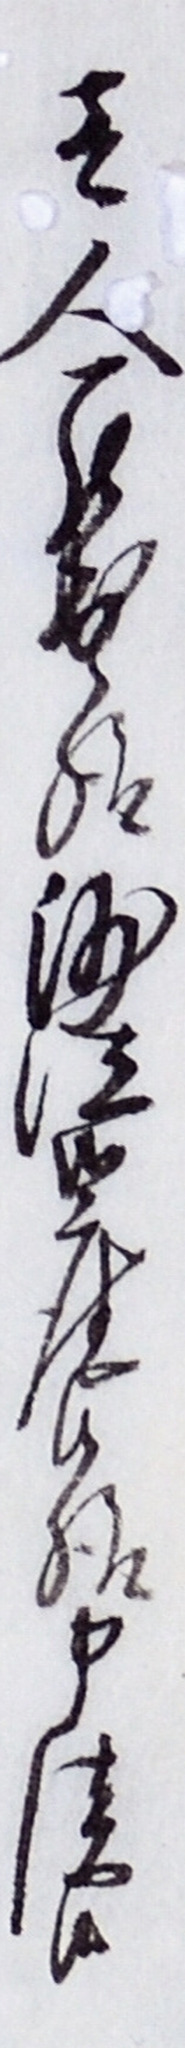壱人罷出候様沙汰御座候様申談候
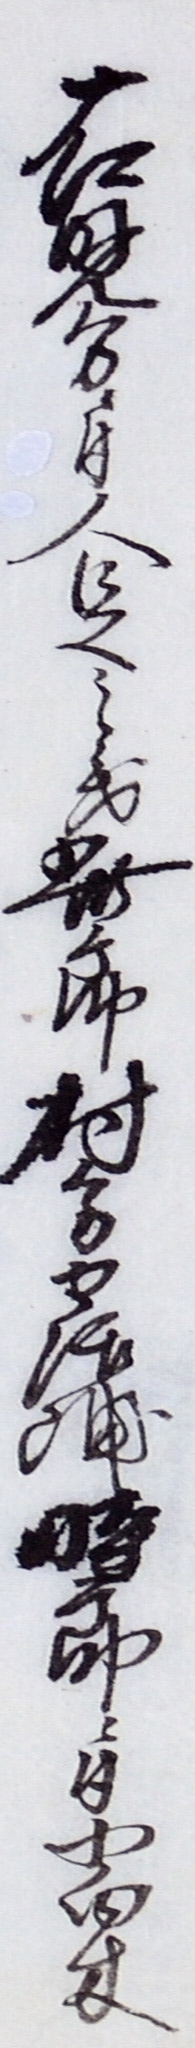一右見分ニ付人足之義此節村方世話鋪時節ニ付小白木
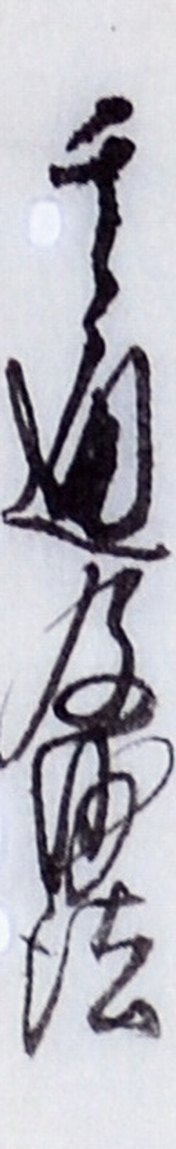其通及沙汰
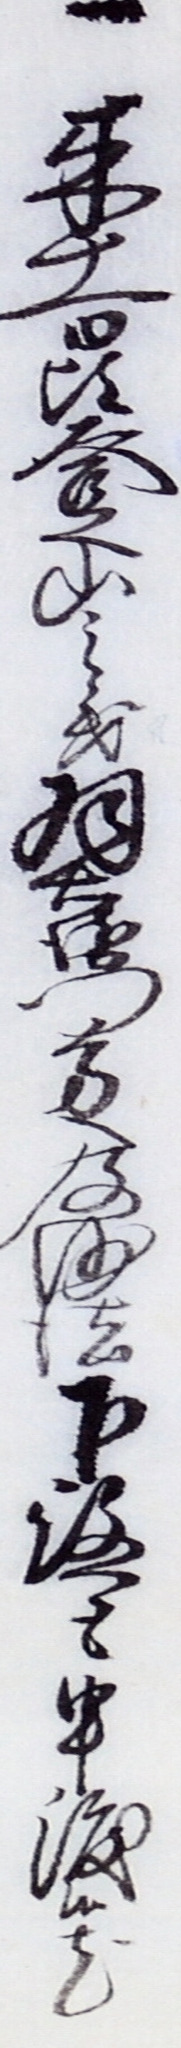一来十一日比登山之義羽右衛門方及沙汰下役へも申渡候尤
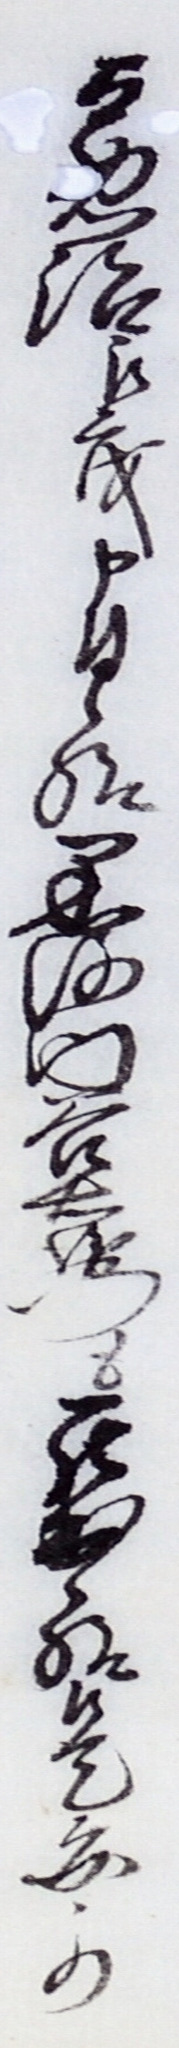与惣治江も申付候様黒河内善右衛門も罷出候様是亦可
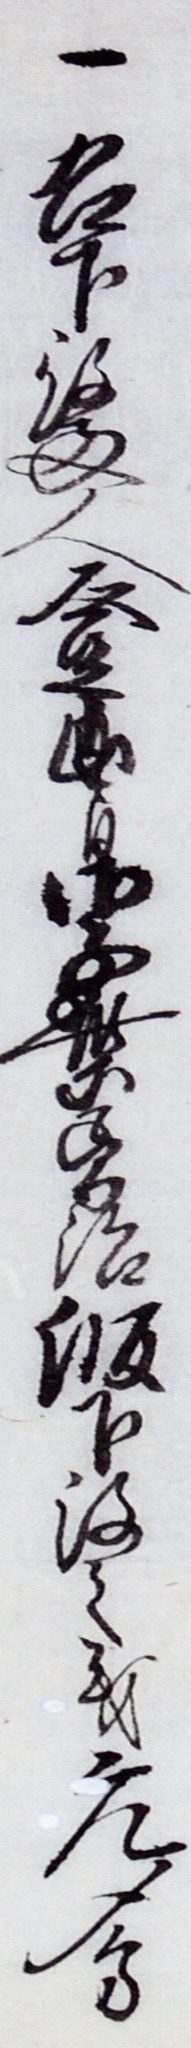一右下役両人登山ニ付御子柴勇治仮下役之義元〆方
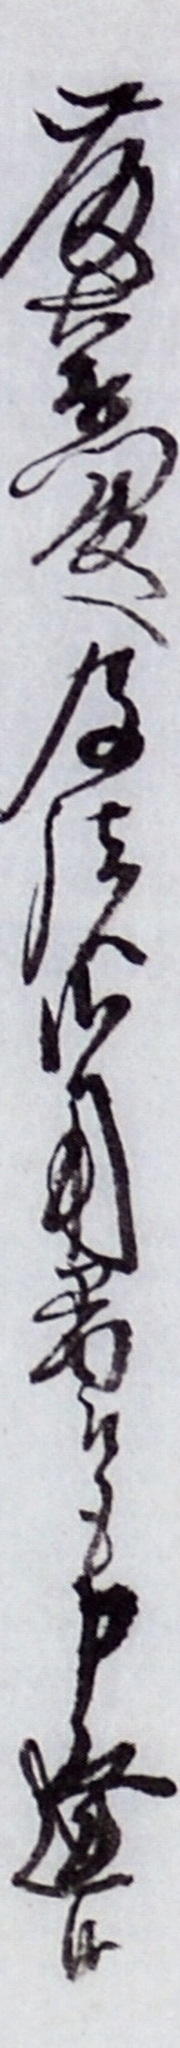藤右衛門へ及談御用番江も申達候
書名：御山奉行御用控
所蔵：伊那市立高遠町図書館・合同会社AMANE
